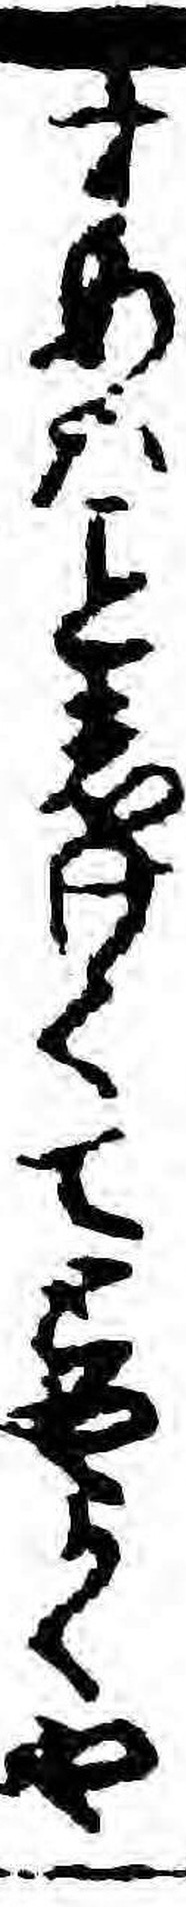すめはことしけくてとやかくや
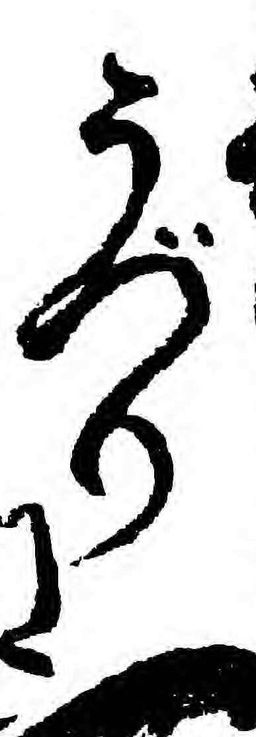うづりに
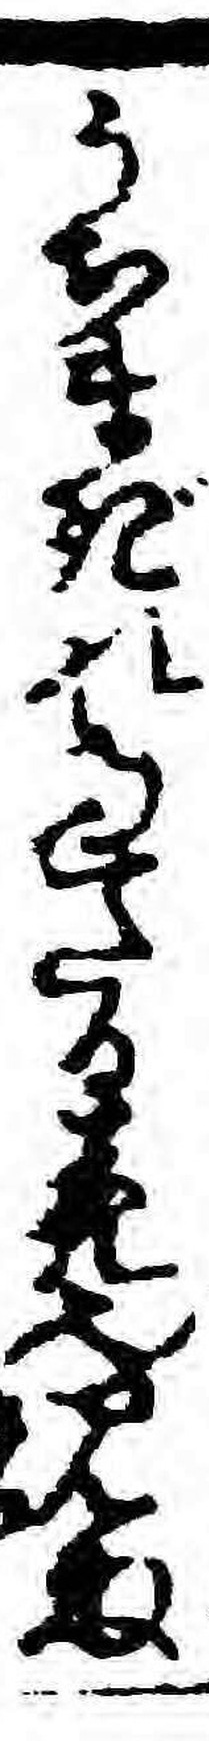うちまぎれ過たる花也見ぬ
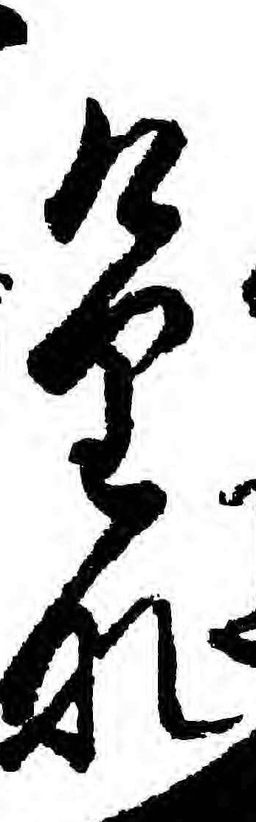けりな
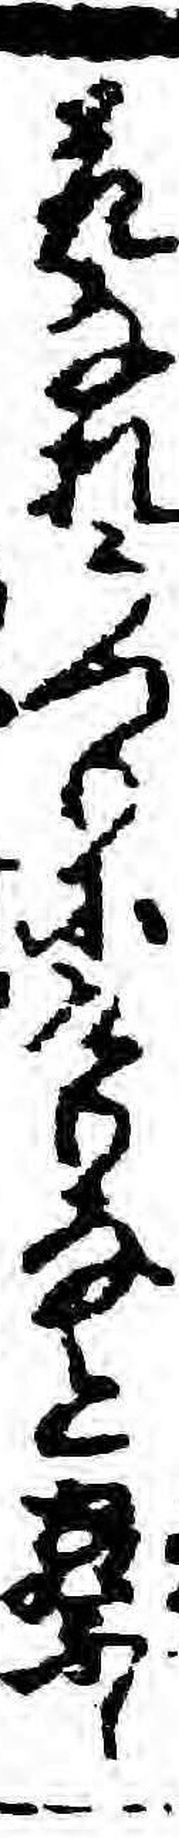花なれうつりにけりなと察し
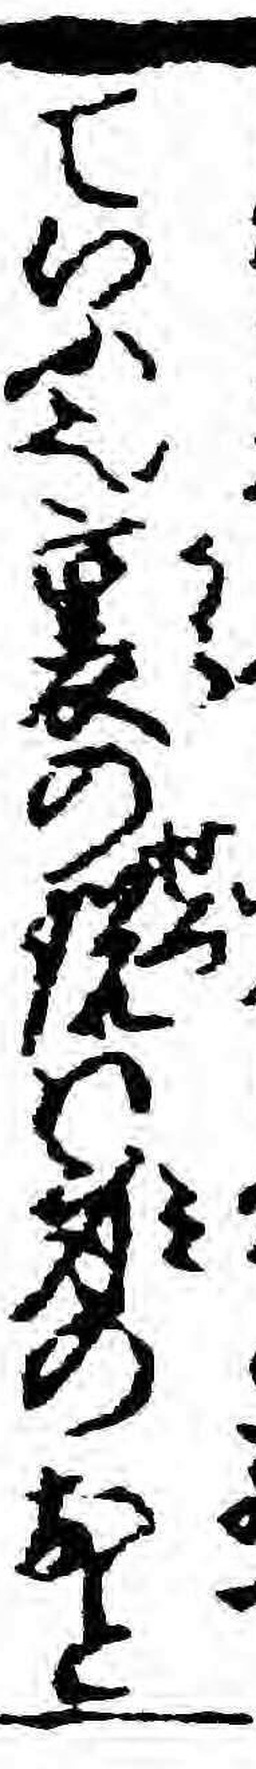ていふ也裏の説は身のおと
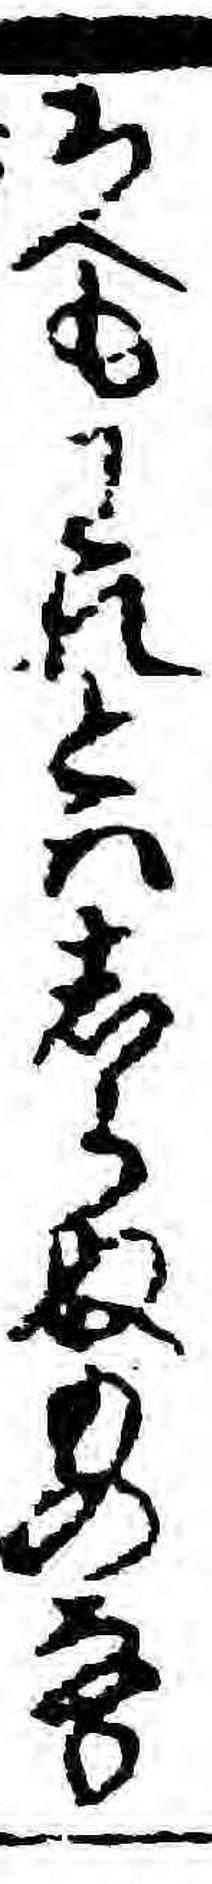ろへもわれとはしらぬものなり
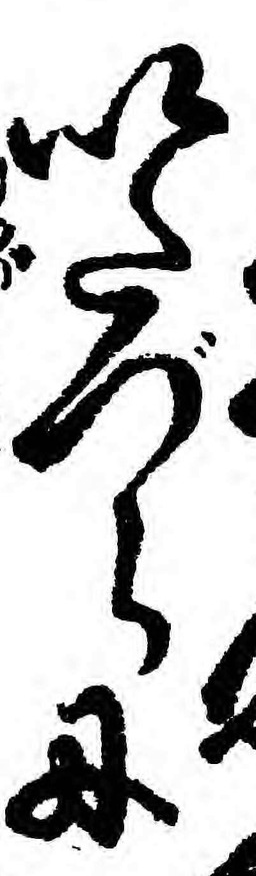いたづらに
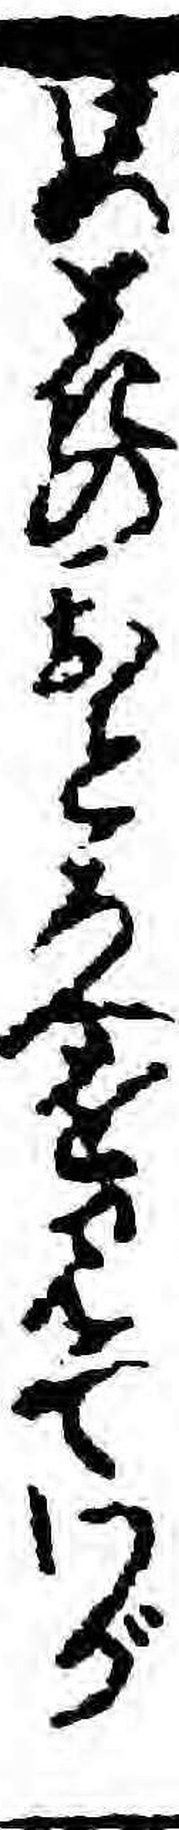只花のおとろへを見てわが
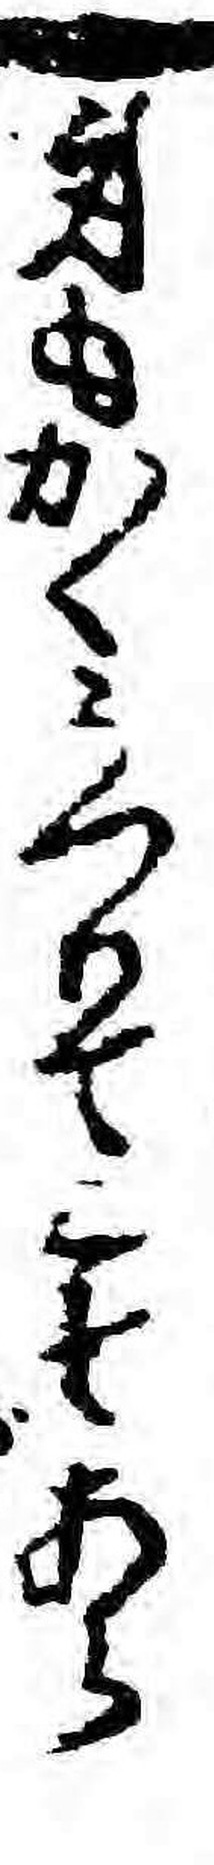身もかくうつりてこそあら
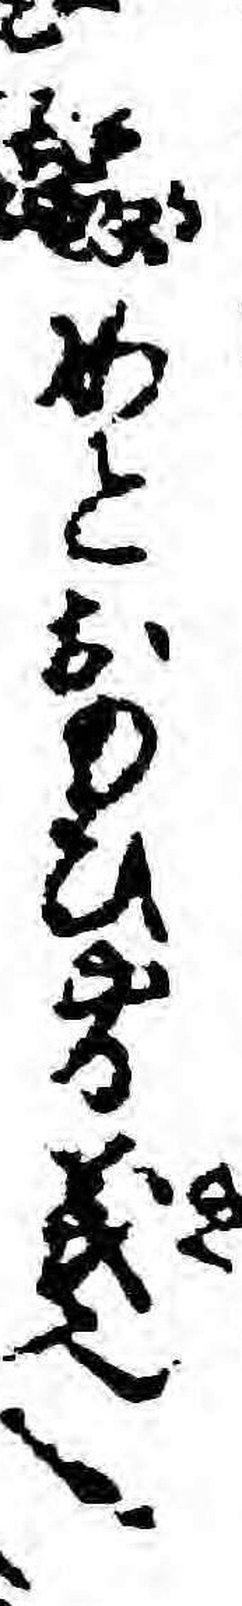めとおもひやる義也
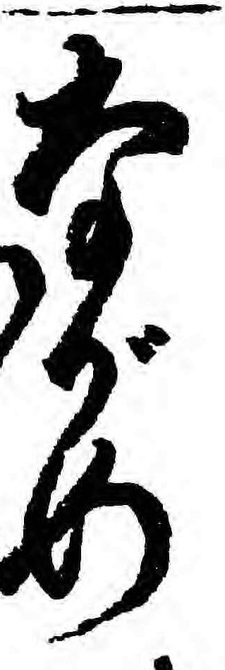ながめ
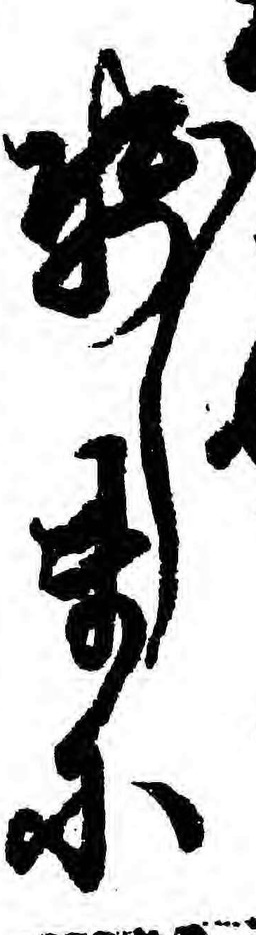せしまに

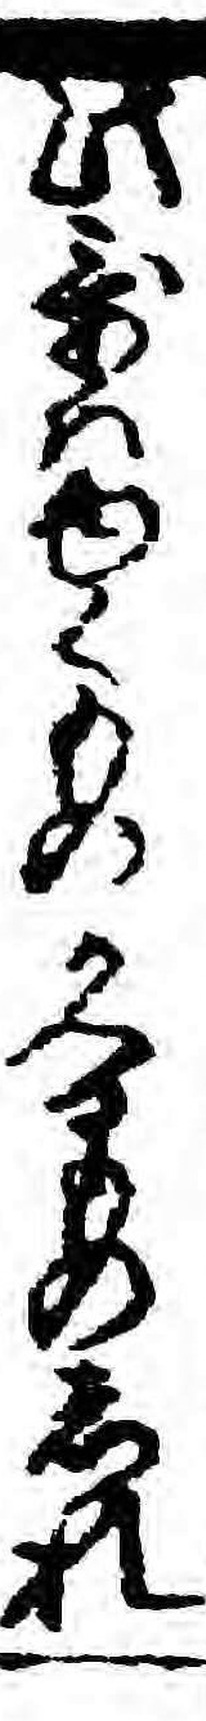此哥はゆくものかへるものしれ
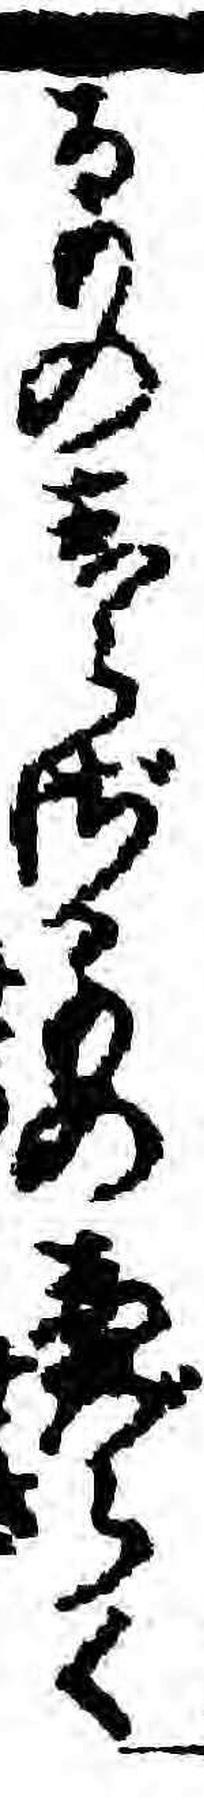るものしらざるものしばらく
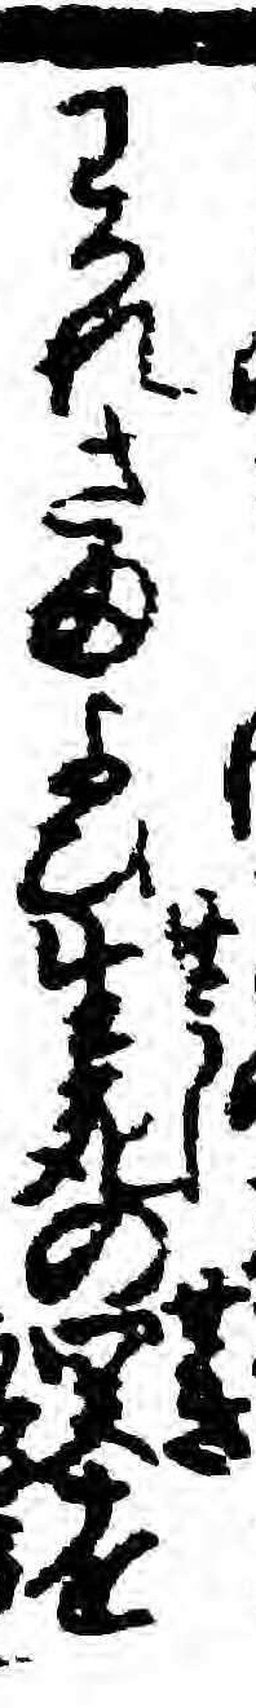わかれさまよひ生死の関を
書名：頭書和歌注譯／壽賀多百人一首小倉錦
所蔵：国文学研究資料館
